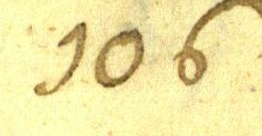106
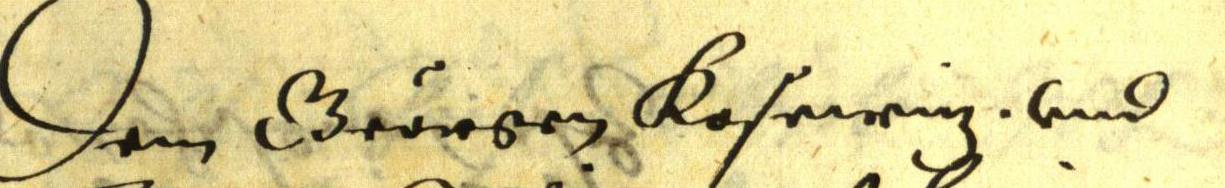Dem Geōrgen Kosewiz. vnd
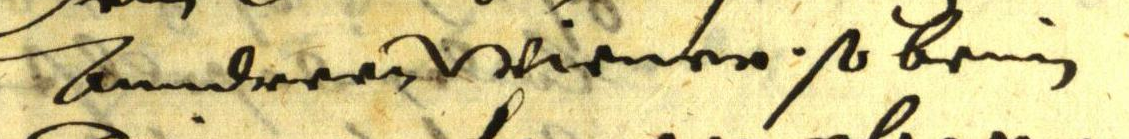Anndreen Wiener. so beim
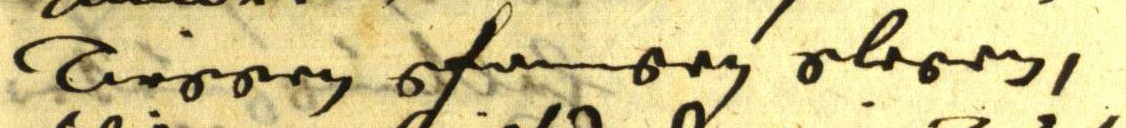Tirggen gfanngen glegen,
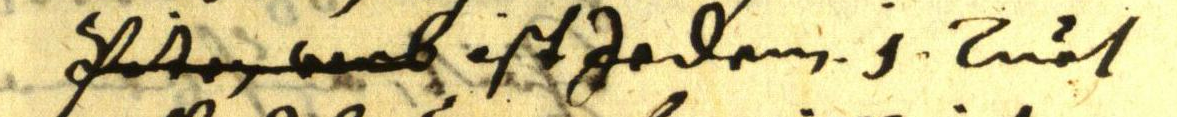piten vmb ist Jedem .1. Tūet
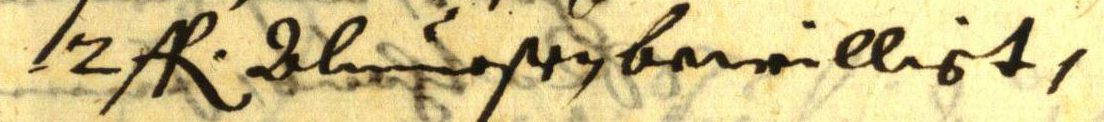2 fl. Almūesen bewilligt,
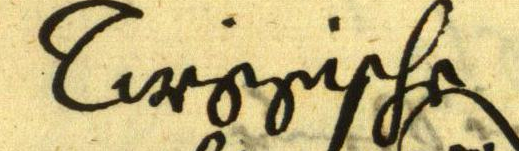Tirggische
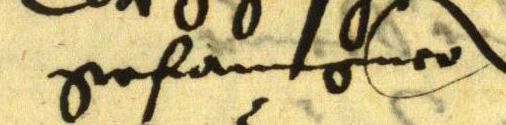gefanngner
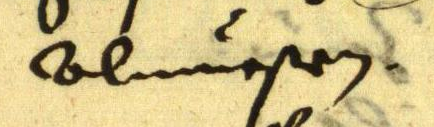Almūesen
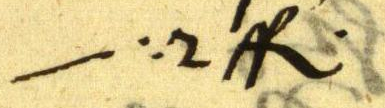—: 2 fl.
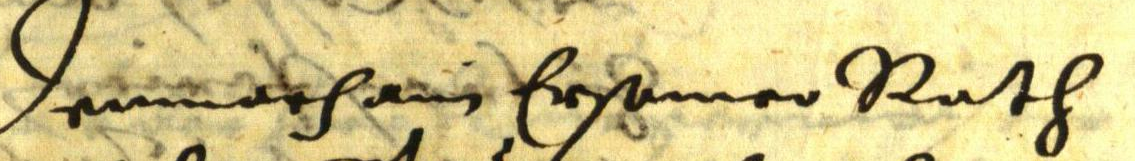Demnach ain Ersamer Rath
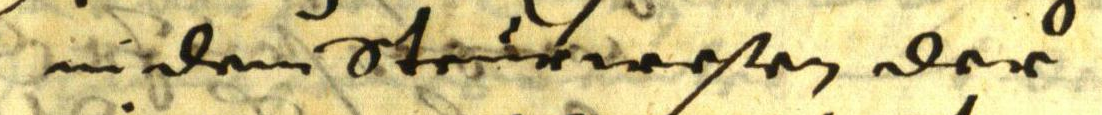in dem Steūrwesen der
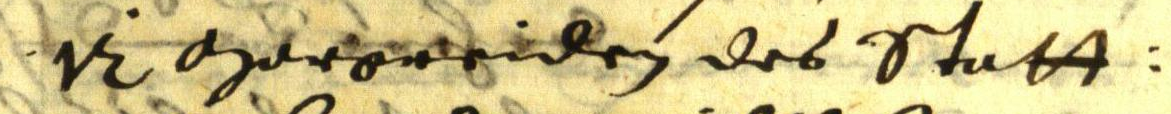12 Margreiden des Statt¬
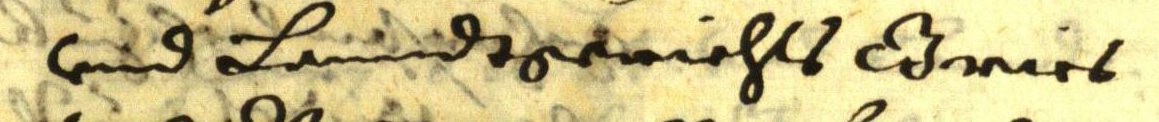vnd Lanndtgerichts Gries
